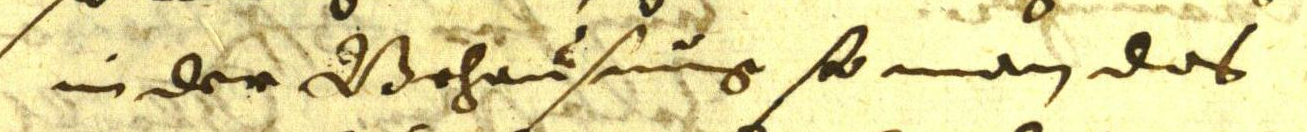in der Behaūsūng so man das
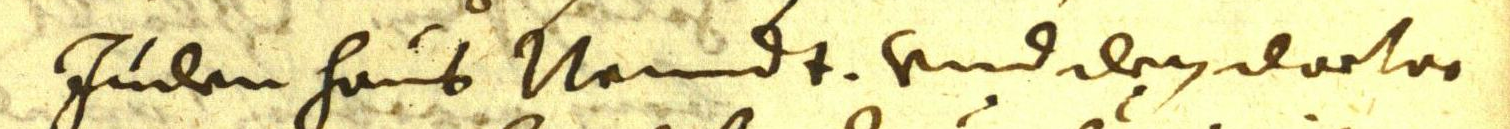Jūden haūs Nenndt. vnd den dorten
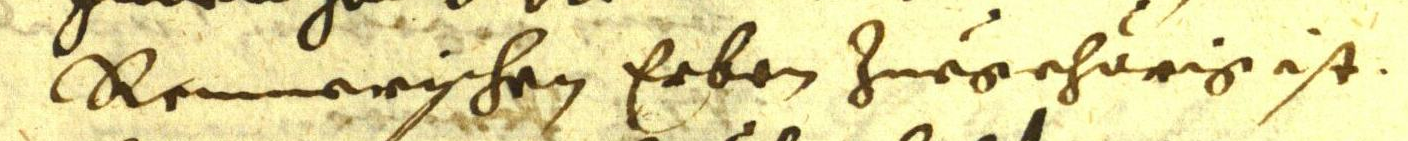Rennerischen Erben Zūegehōrig ist.
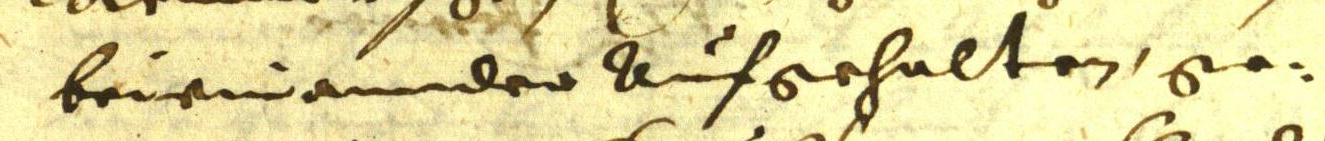beieinannder Aūfgehalten, ge¬
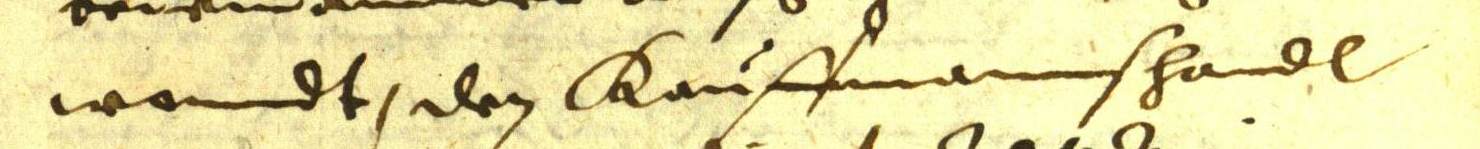wanndt, den Kaūffmannshandl
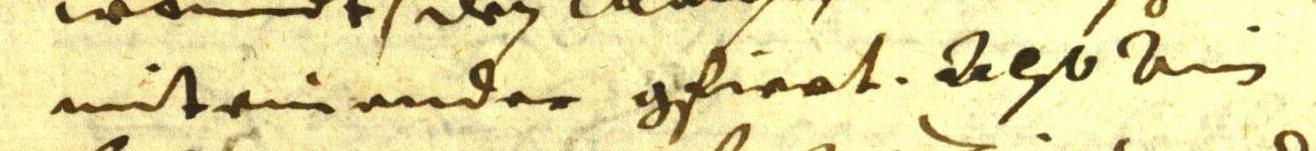miteinander gfiert. Also Ain
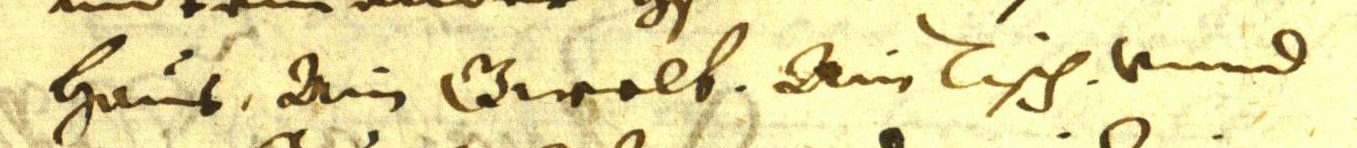Haūs, Ain Gwerb. Ain Tisch. vnnd
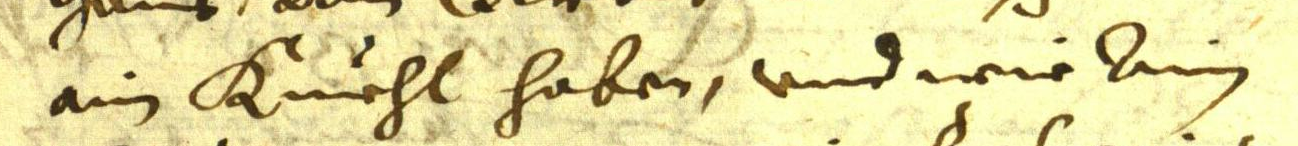ain Kūchl haben, vnd wie Ain
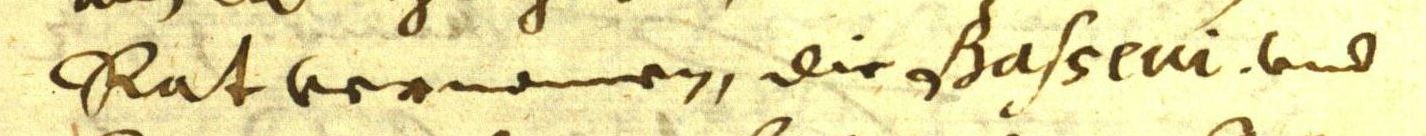Rat vernomen, die Basseni. vnd
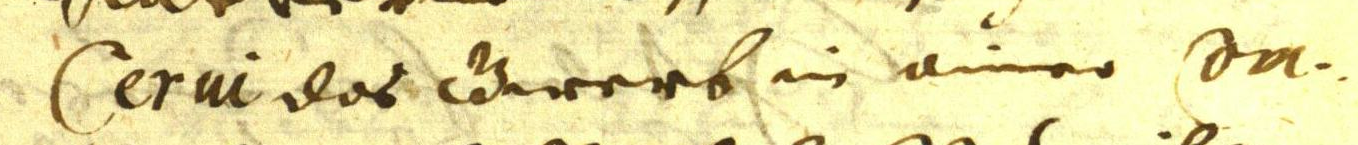Cerni das Gwerb in ainer Com¬
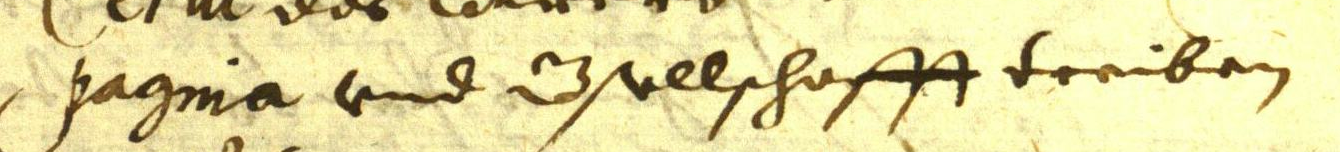pagnia vnd Gsellschafft treiben
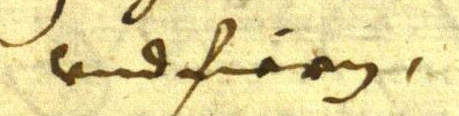vnd fiern,
